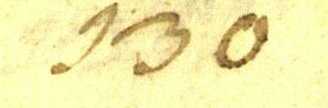130
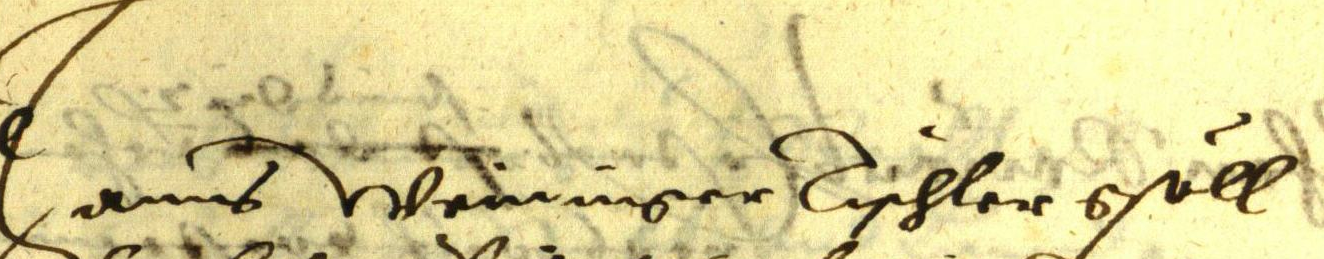Hanns Weininger Tischler gsōll
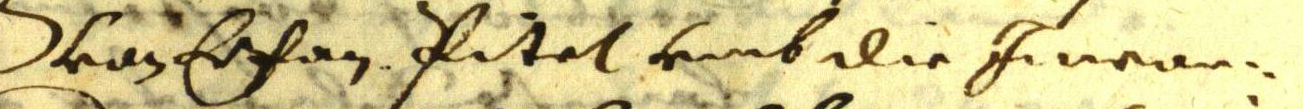von Epan. Pitet vmb die Inwon¬
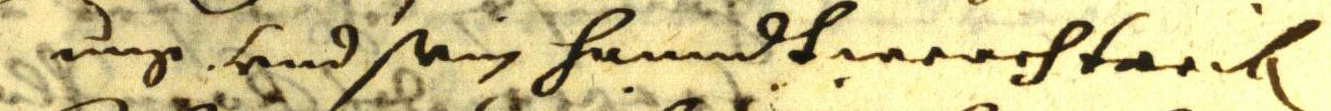ūng. vnd sein hanndtwerch treib
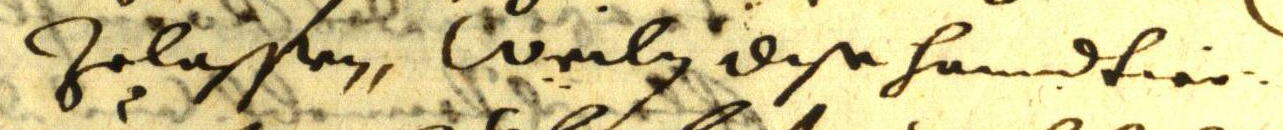Zelassen, Weiln dise hanndtier¬
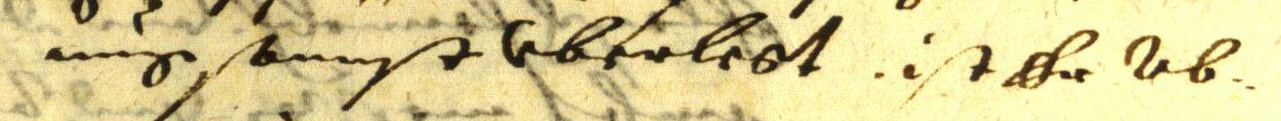ūng sonnst v̈berlegt. ist Er Ab¬
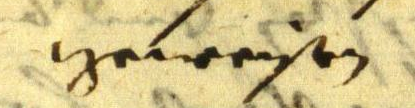zeweisen
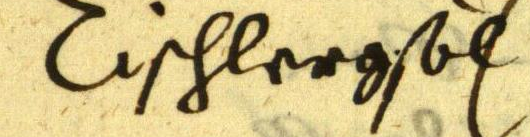Tischlergsōl
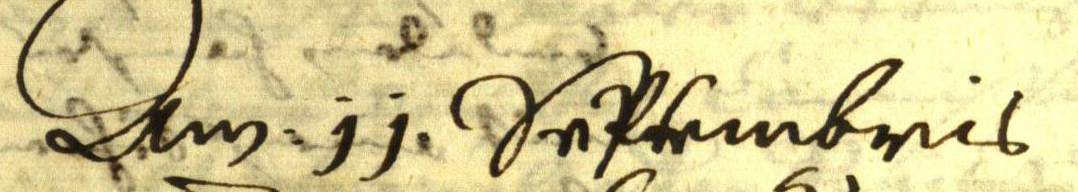Am: 11. SePtembris
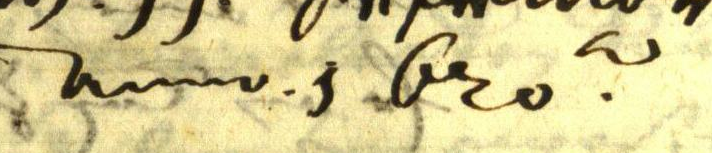Anno .1620.t
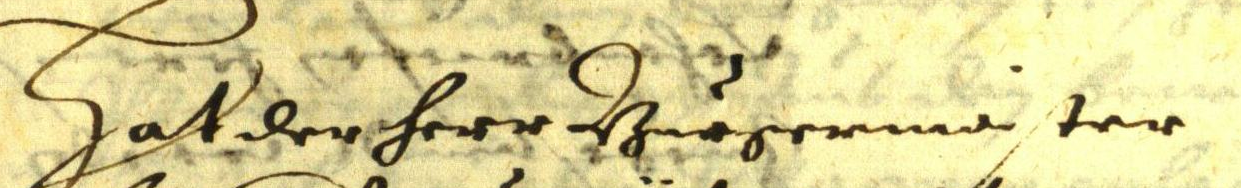Hat der herr Būrgermaister
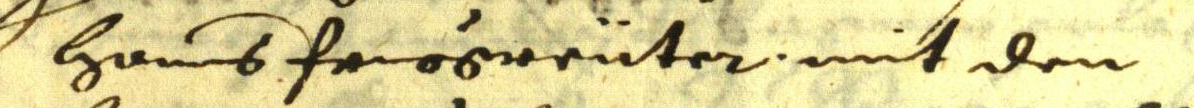Hans Prūggreüter. mit den
